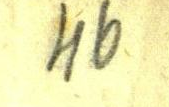46
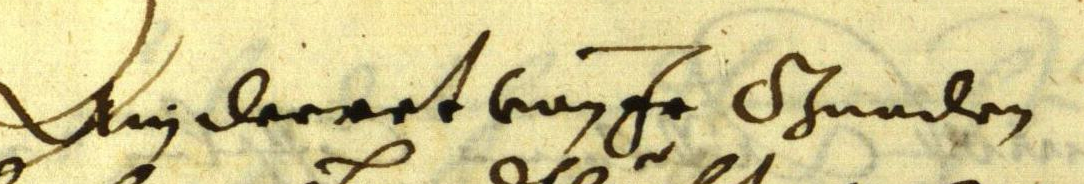Ain decret von Ir Gnaden
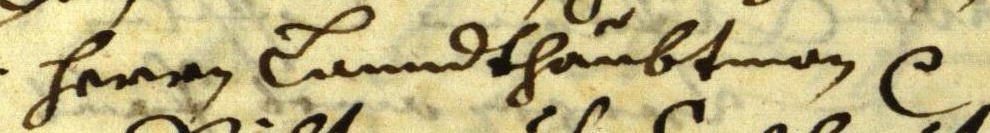herrn Lanndthaūbtman etc.
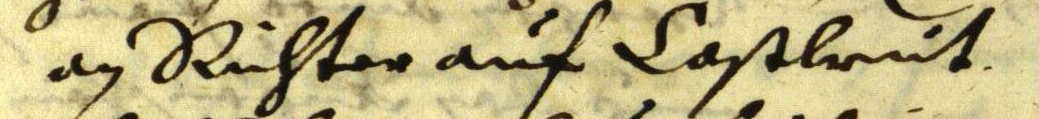an Richter aūf Castlrūt.
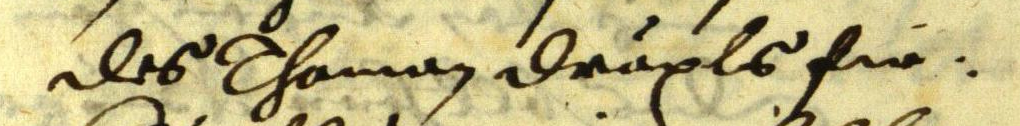des Thoman drāxls fir¬
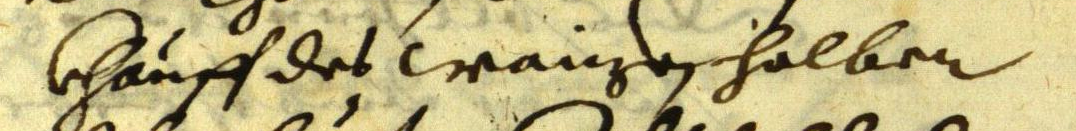khaūff des Waizen halber
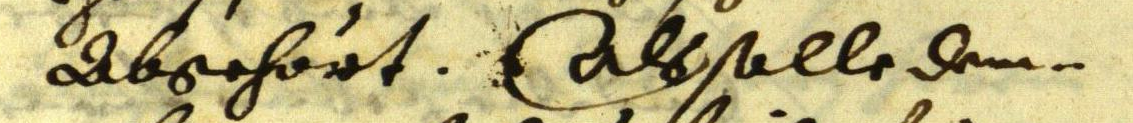Abgehōrt. Als solle dem¬
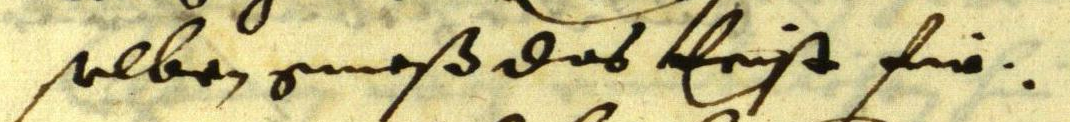selben gmeß das Eeist fir¬
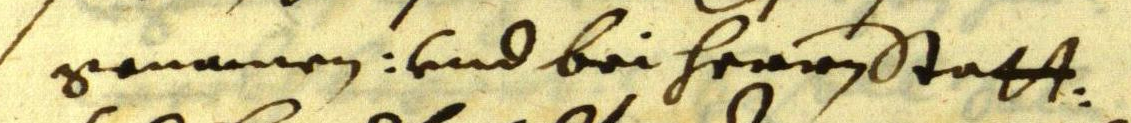genomen: vnd bei herrn Statt¬
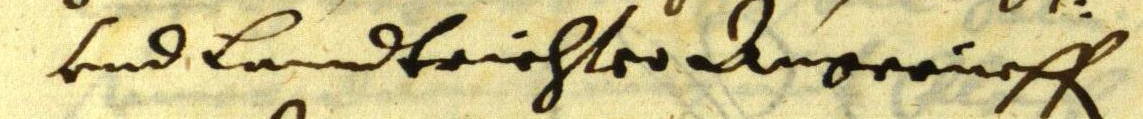vnd Lanndtrichter Angerūeff
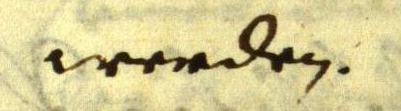werden.
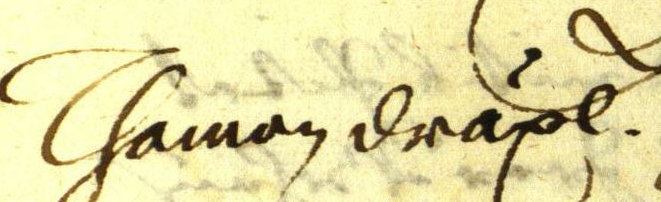Thoman drāxl.
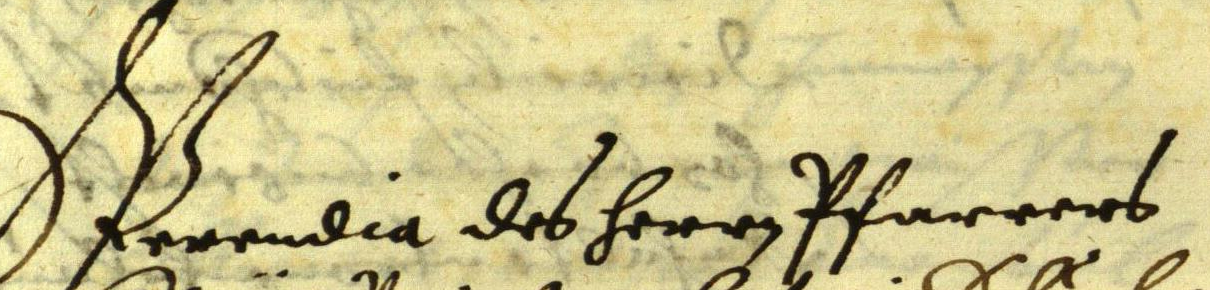Sperendia des herrn Pfarrers
